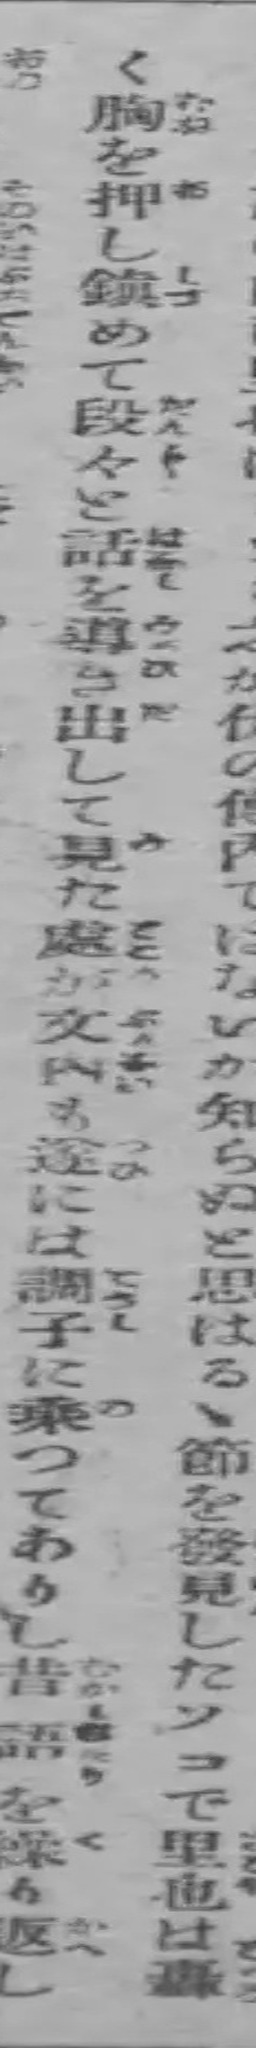く胸を押し鎮めて段々と話を導き出して見た処が文内も遂には調子に乗つてありし昔語を繰り返し
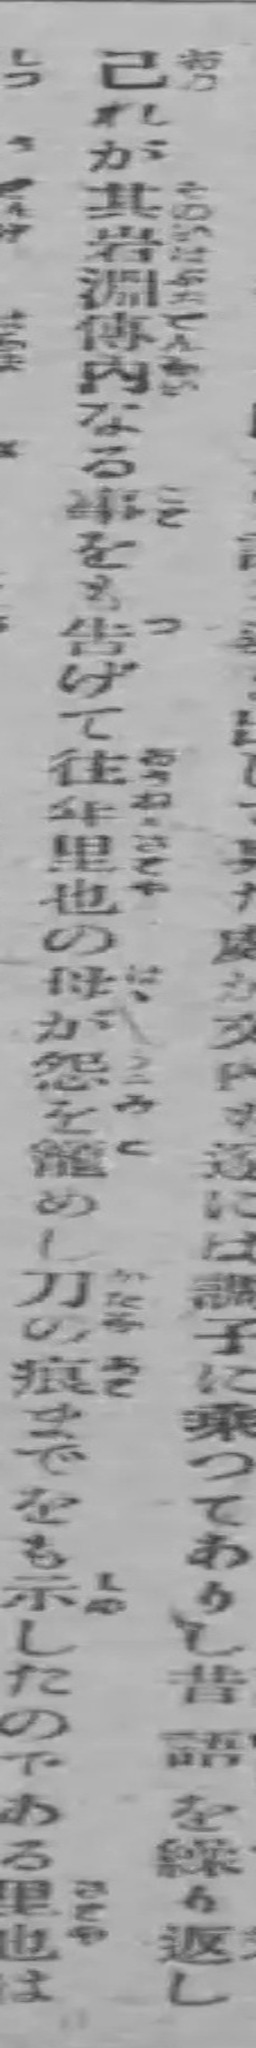己れが其岩淵伝内なる事をも告げて往年里也の母が怨を籠めし刀の痕までをも示したのである里也は
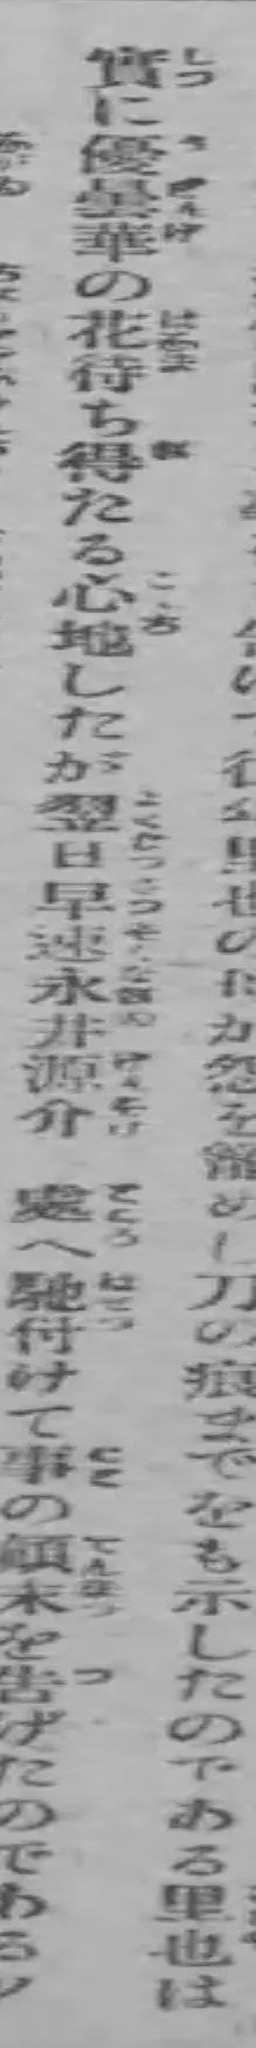実に優曇華の花待ち得たる心地したが翌日早速永井源介の処へ馳付けて事の顛末を告げたのであるソ
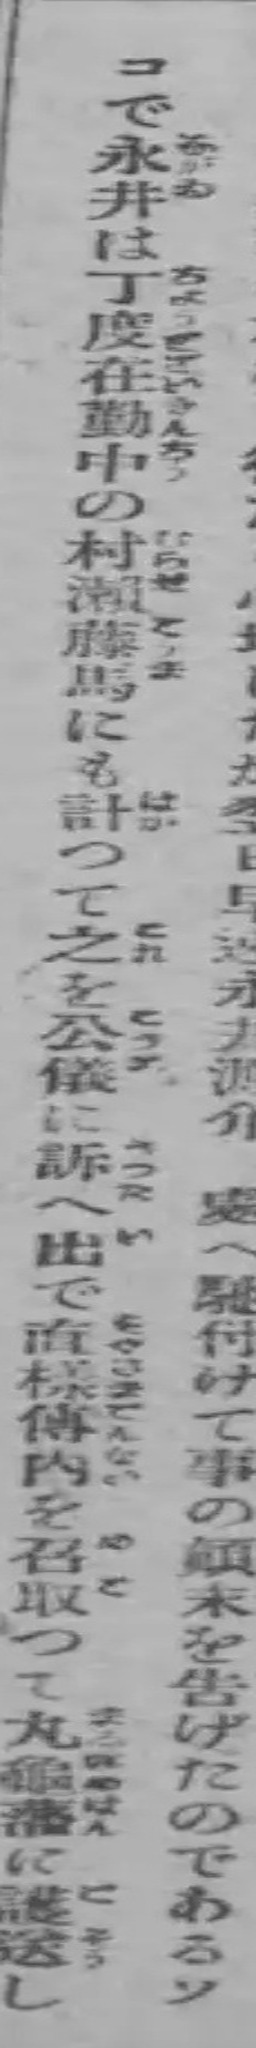コで永井は丁度在勤中の村瀬藤馬にも計つて之を公儀に訴へ出で直様伝内を召取つて丸亀藩に護送し
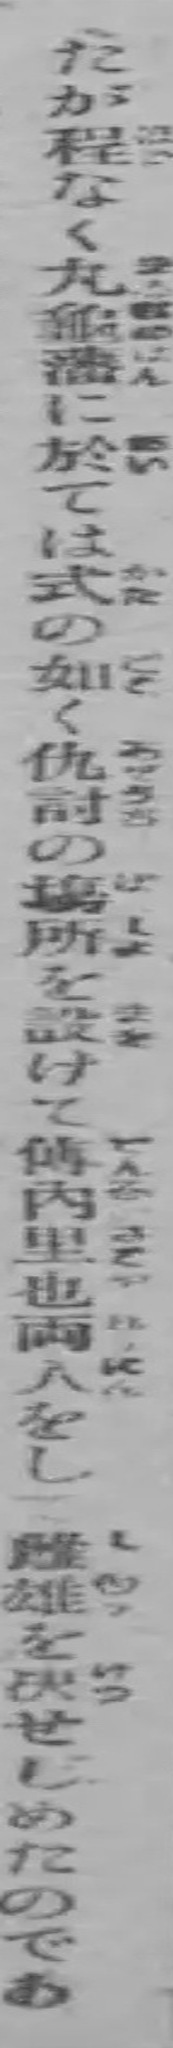たが程なく丸亀藩に於ては式の如く仇討の場所を設けて伝内里也両人をして雌雄を決せしめたのであ
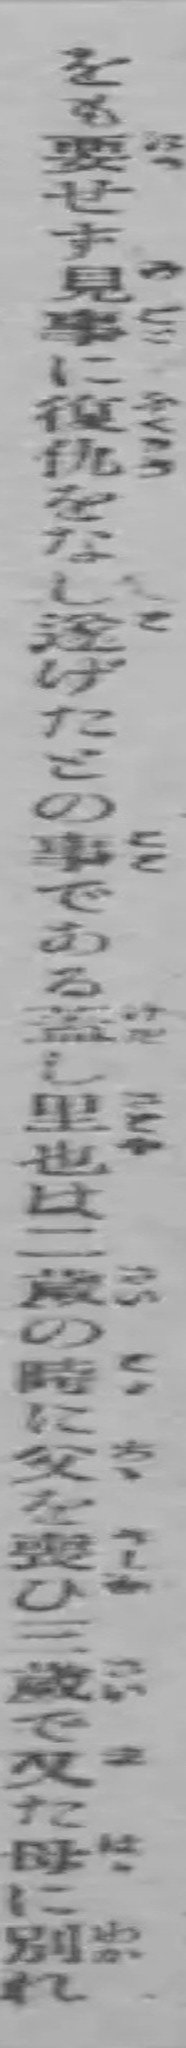をも要せず見事に復仇をなし遂げたとの事である蓋し里也は二歳の時に父を喪ひ三歳で又た母に別れ
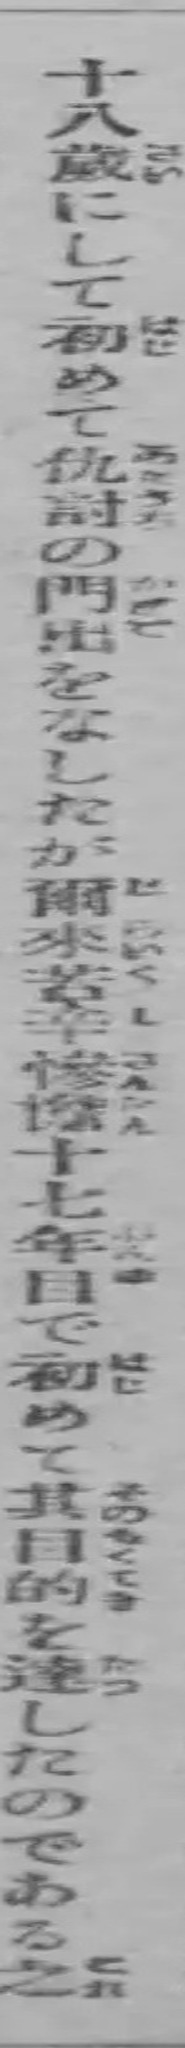十八歳にして初めて仇討の門出をなしたが爾来苦辛惨憺十七年目で初めて其目的を達したのである之
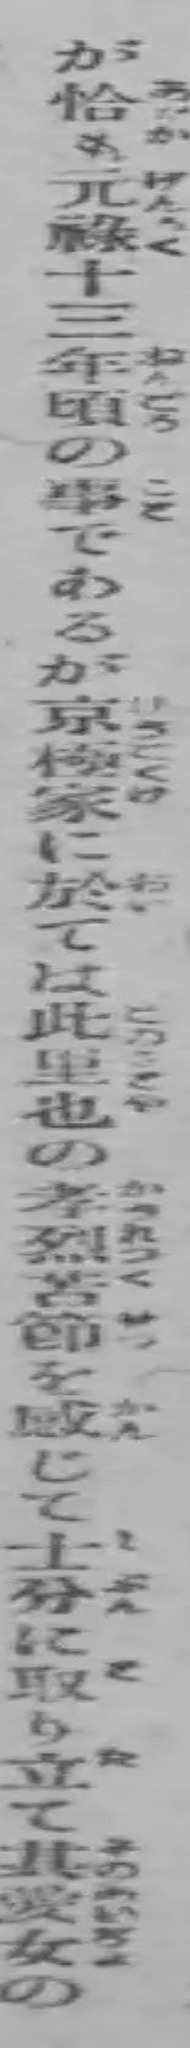が恰も元禄十三年頃の事であるが京極家に於ては此里也の孝烈苦節を感じて士分に取り立て其愛女の
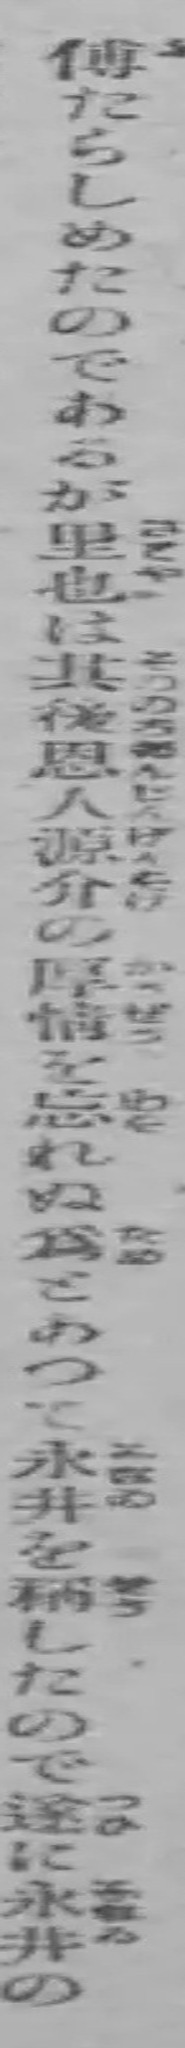傅たらしめたのであるが里也は其後恩人源介の厚情を忘れぬ為とあつて永井を称したので遂に永井の
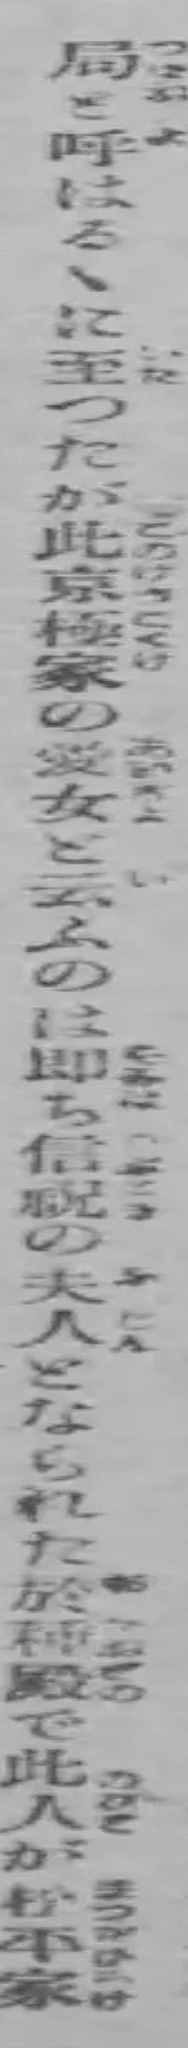局と呼はるゝに至つたが此京極家の愛女と云ふのは即ち信祝夫人となられた於種殿で此人が松平家
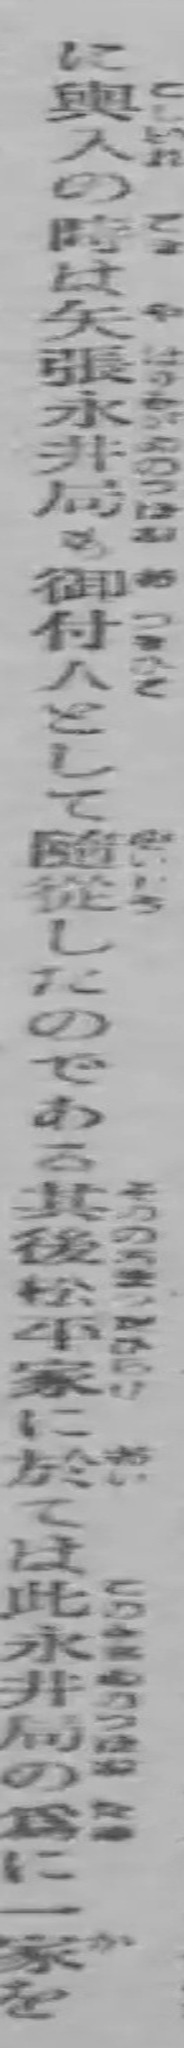に輿入の時は矢張永井局も御付人として随従したのである其後松平家に於ては此永井局の為に一家を
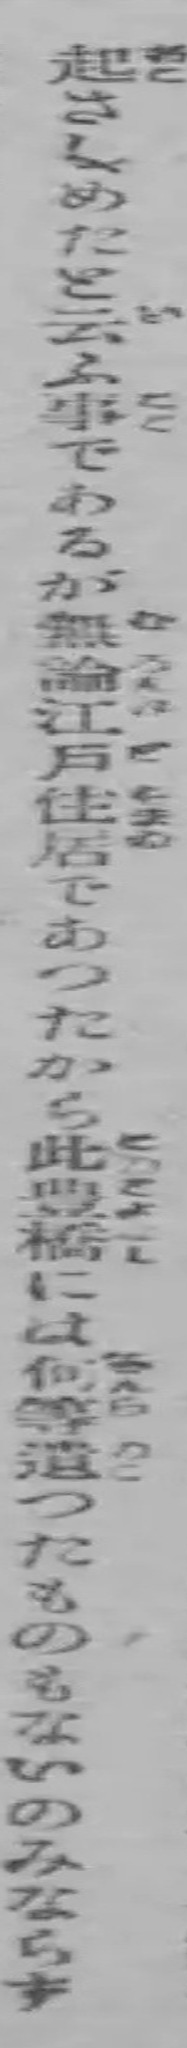起さしめたと云ふ事であるが無論江戸住居であつたから此豊橋には何等遺つたものもないのみならず
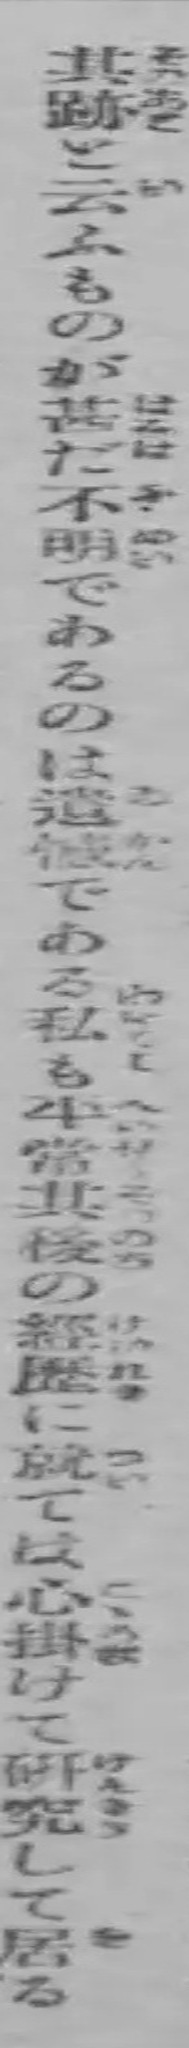其跡と云ふものが甚だ不明であるのは遺憾である私も平常其後の経歴に就ては心掛けて研究して居る
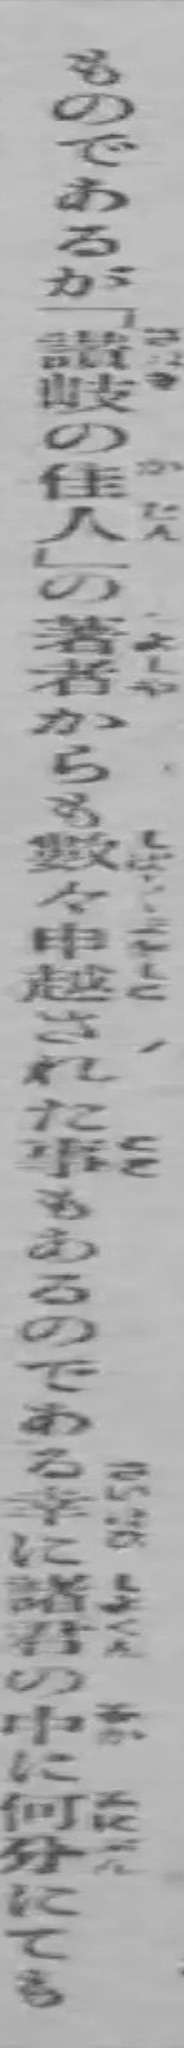ものであるが「讃岐の佳人」の著者からも数々申越された事もあるのである幸に諸君の中に何分にても
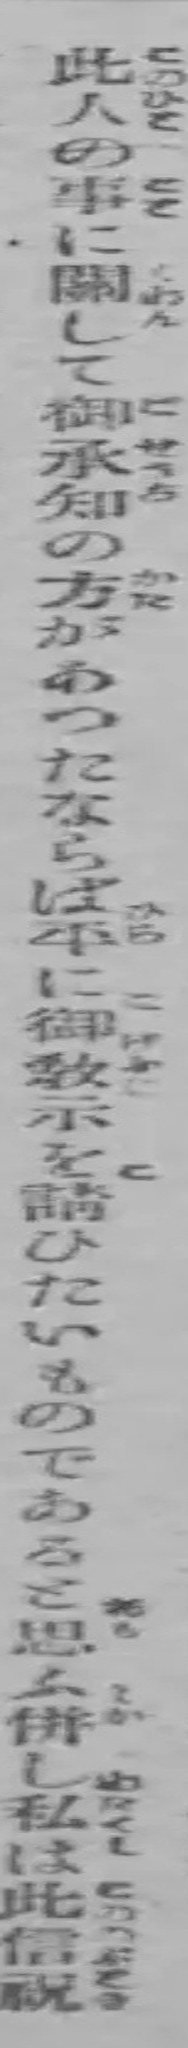此人の事に関して御承知の方があつたならば平に御教示を請ひたいものであると思ふ併し私は此信祝
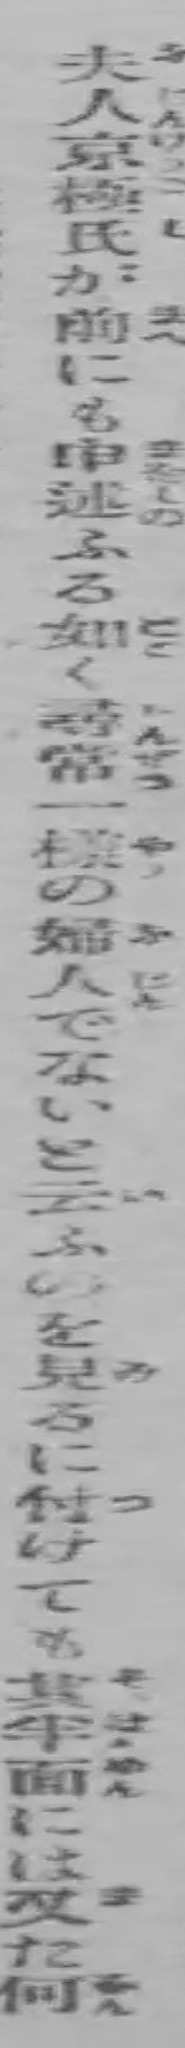夫人京極氏が前にも申述ふる如く尋常一様の婦人でないと云ふのを見るに付けても其半面には又た何
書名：豊橋市史談
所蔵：国立国会図書館 National Diet Library, JAPAN
